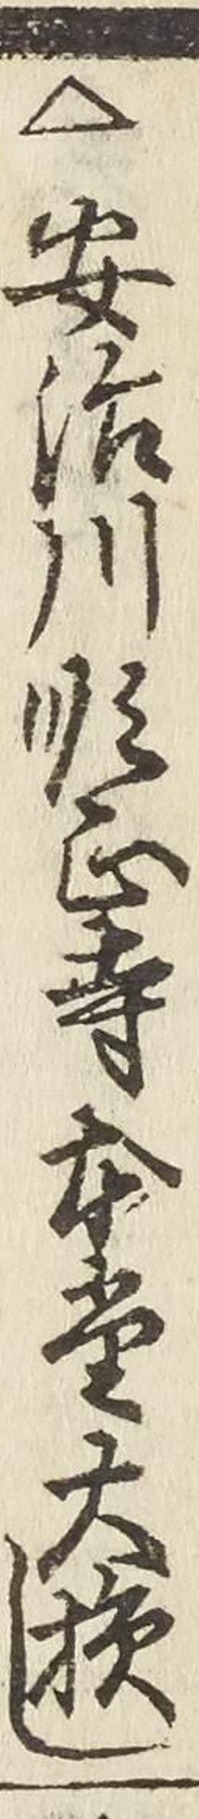△安治川順正寺本堂大損し
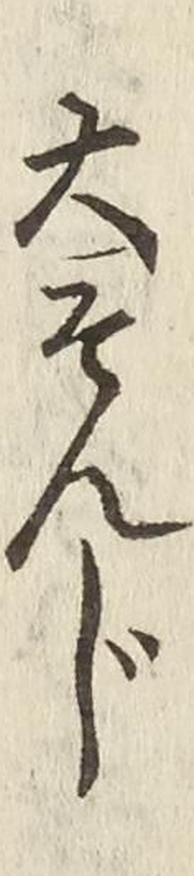大そんじ
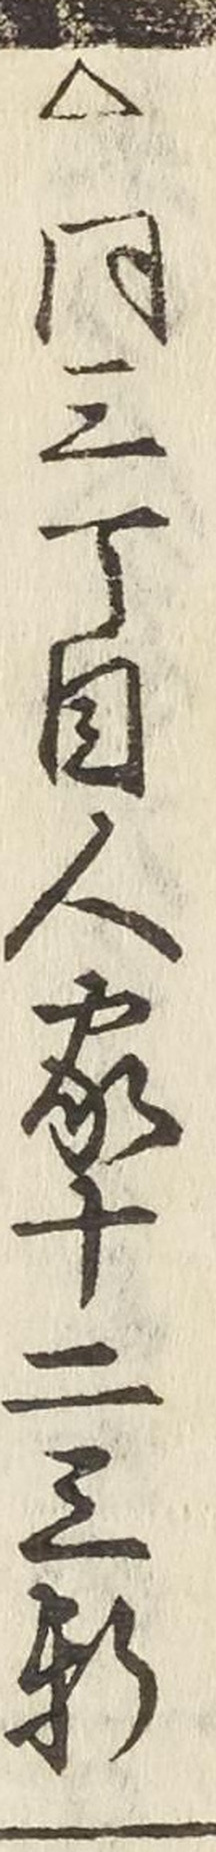△同三丁目人家十二三軒
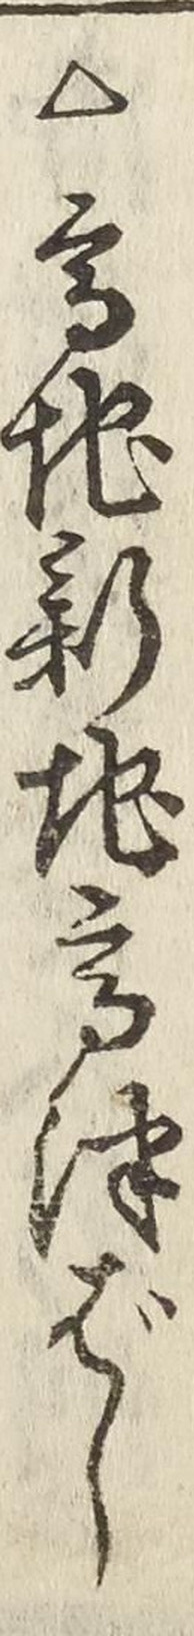△高地新地高津ばし
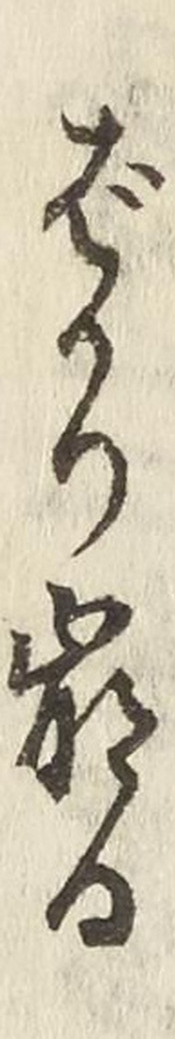ばかり崩る
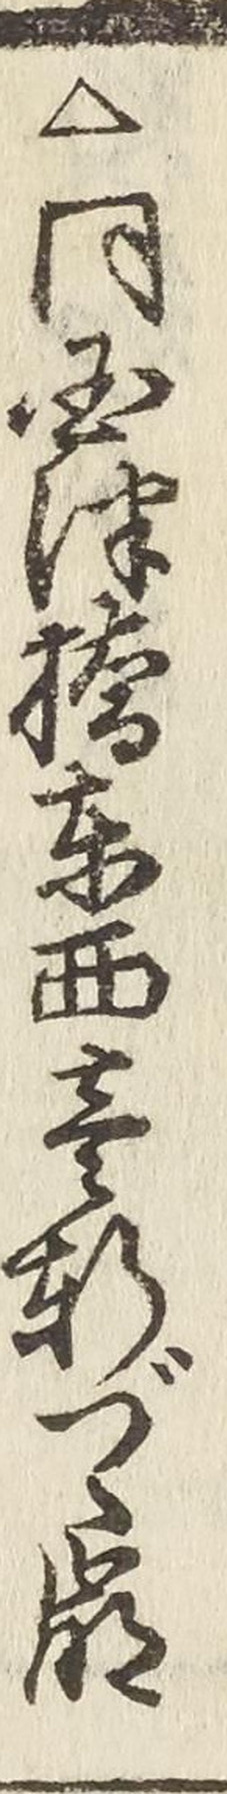△同国津橋東西壱軒づゝ崩
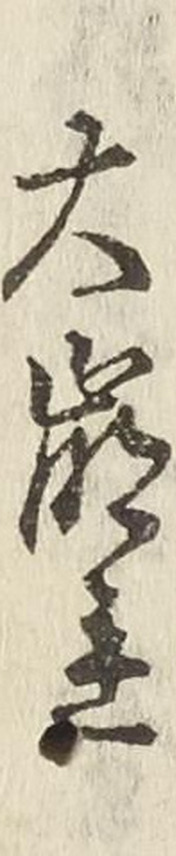大崩れ
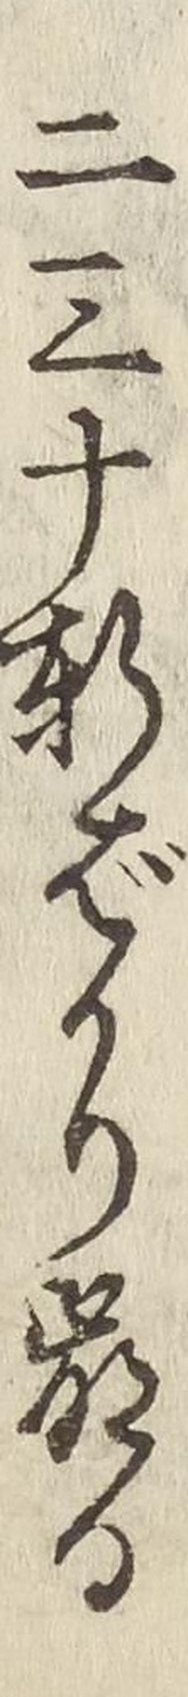二三十軒ばかり崩る
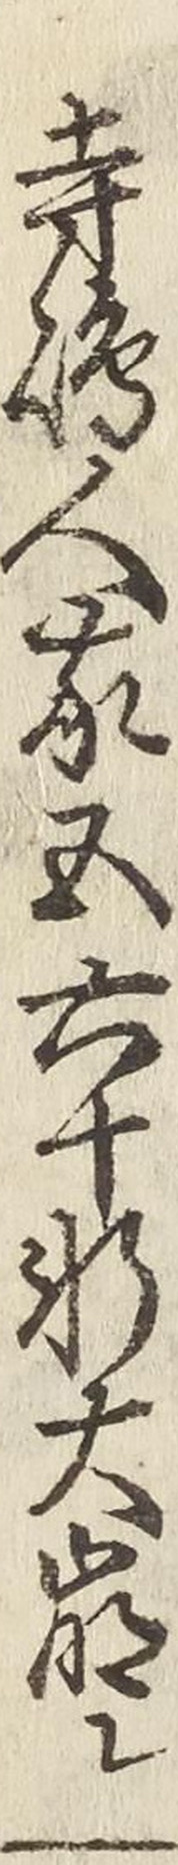寺嶋人家五六十軒大崩レ

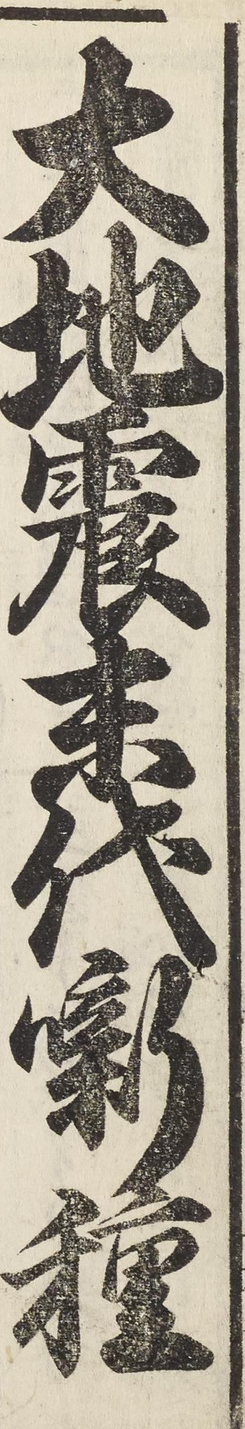大地震末代噺種
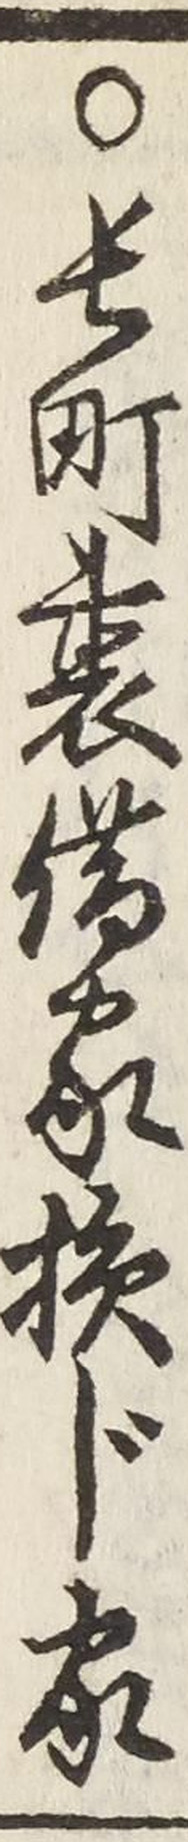○長町裏借家損じ家
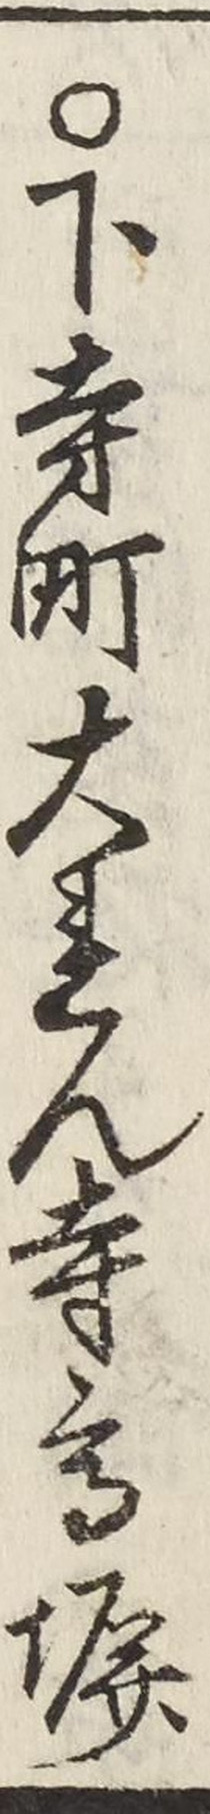○下寺町大れん寺高塀
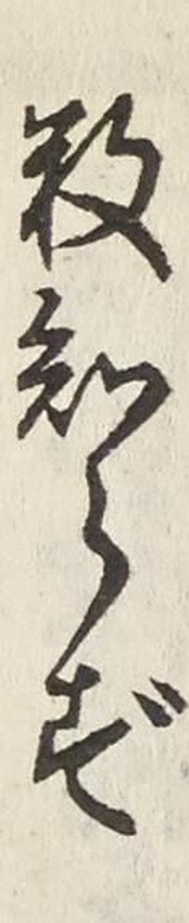数知らず
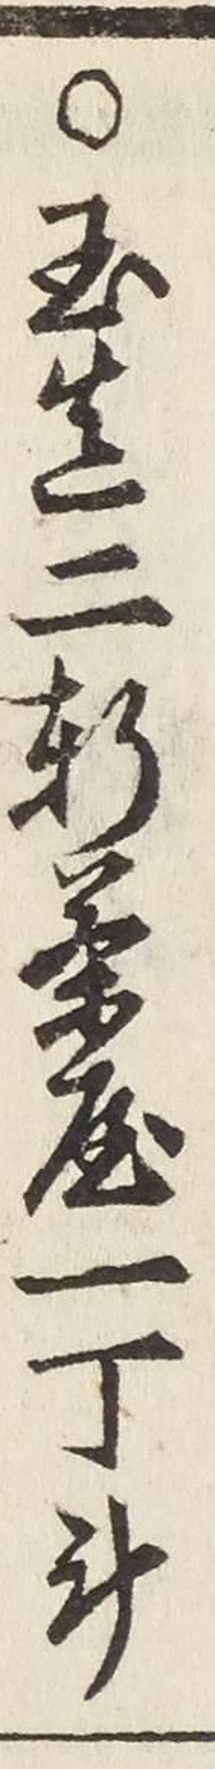○玉造二軒茶屋一丁斗
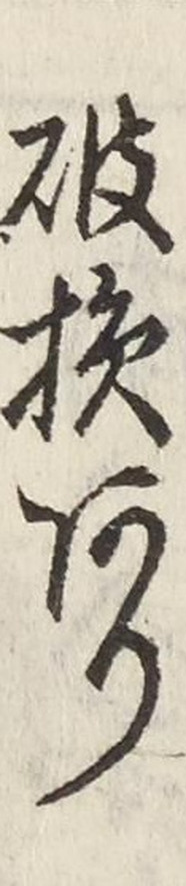破損あり
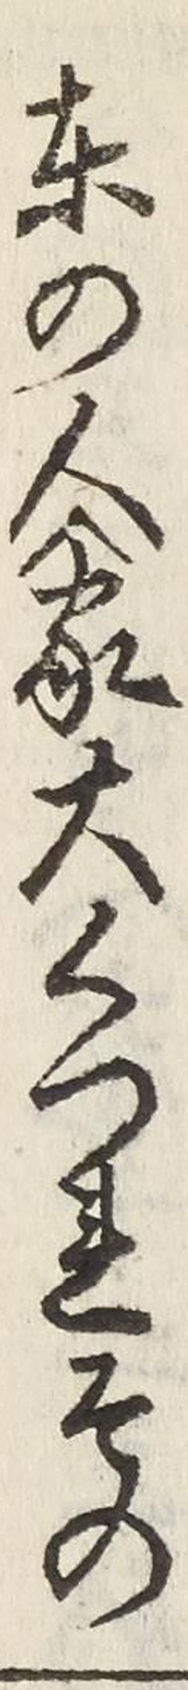東の人家大くつれその
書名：大地震大津浪末代噺種　（二編　全）
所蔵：東京大学地震研究所図書室 Earthquake Research Institute Library, The University of Tokyo, JAPAN
